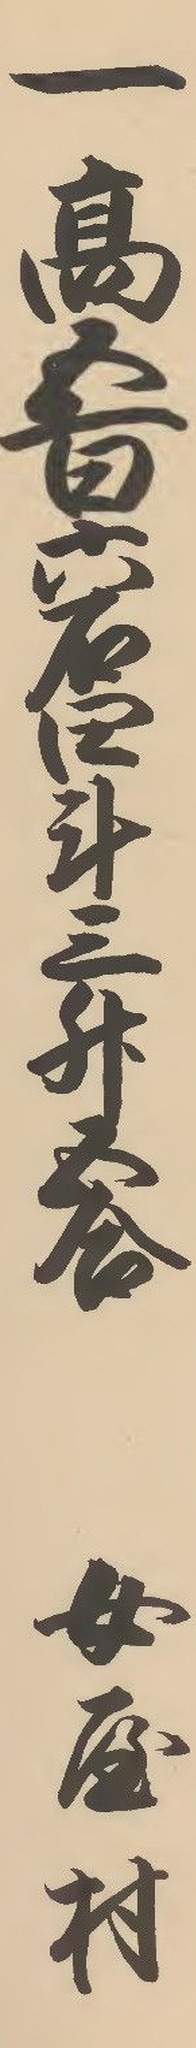一髙五百六石四斗三升弐合女屋村
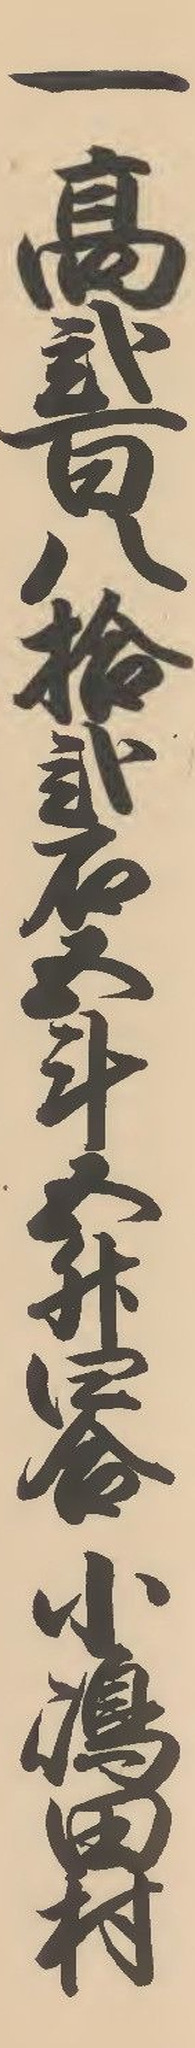一髙弐百八拾弐石五斗五升四合小嶋田村
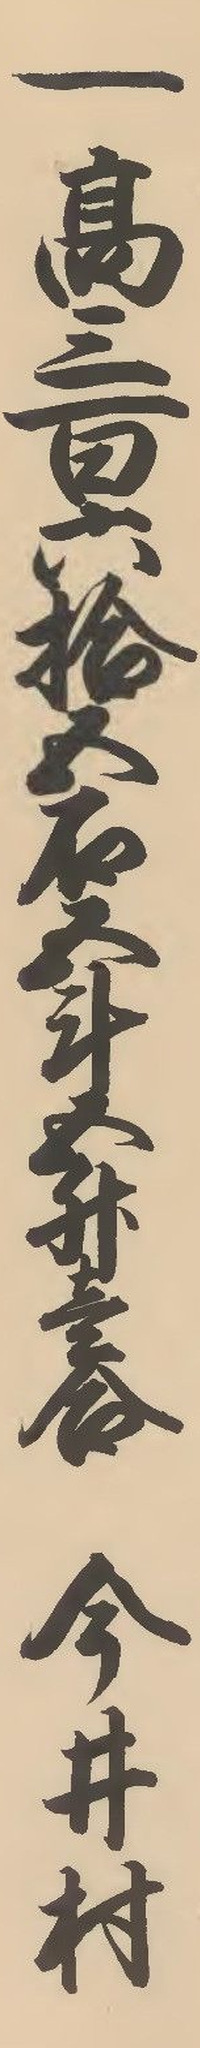一髙三百六拾五石五斗五升壱合今井村
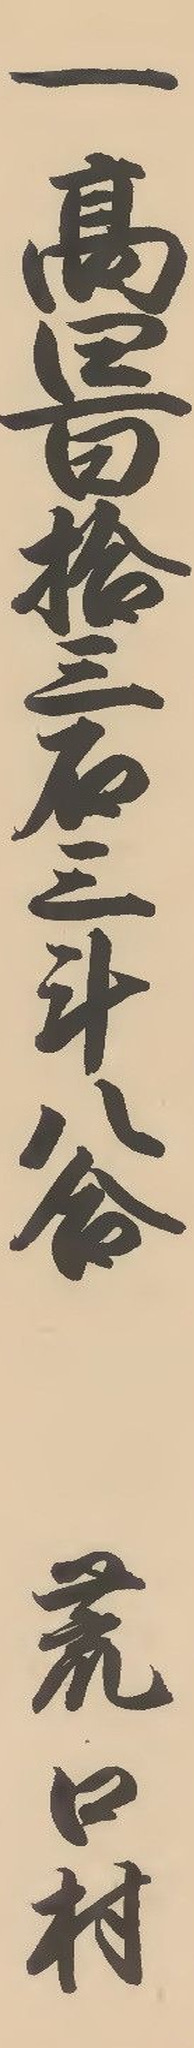一髙四百拾三石三斗八合荒口村
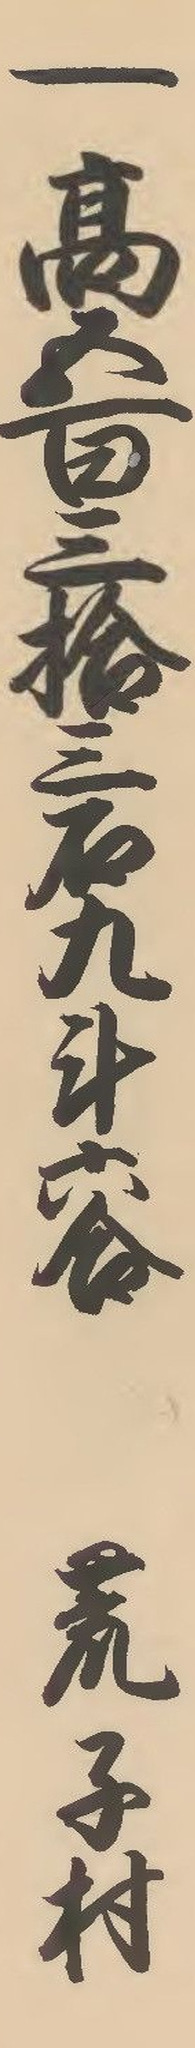一髙五百三拾三石九斗六合荒子村

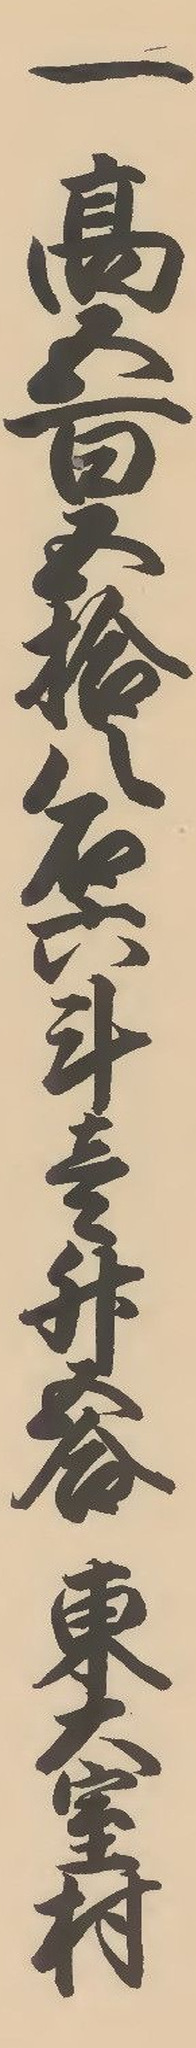一髙五百五拾八石六斗壱升五合東大室村
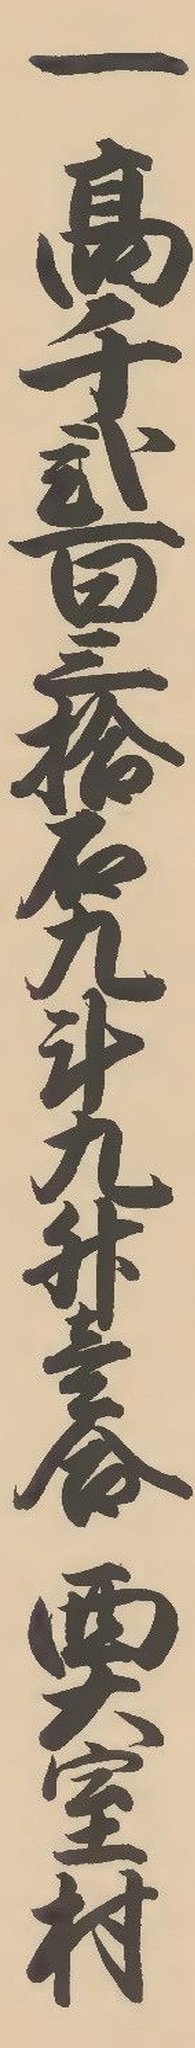一髙千弐百三拾石九斗九升壱合西大室村
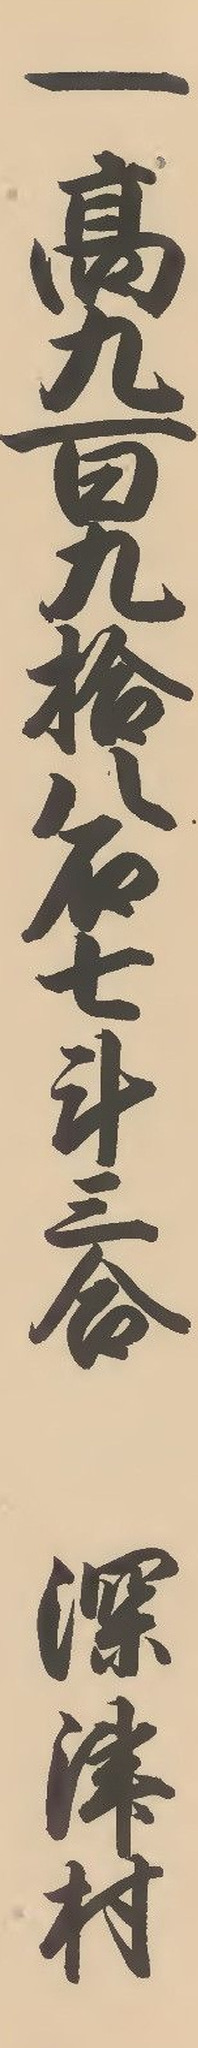一髙九百九拾八石七斗三合深津村
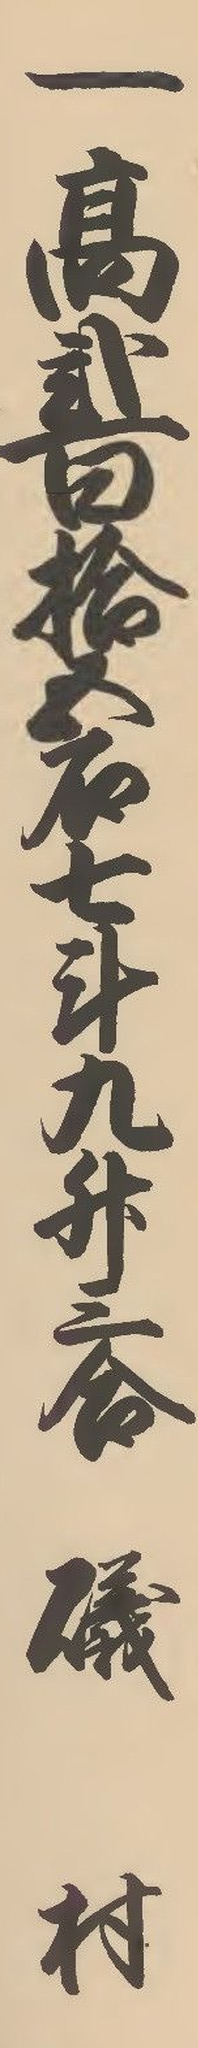一髙弐百拾五石七斗九升三合礒村
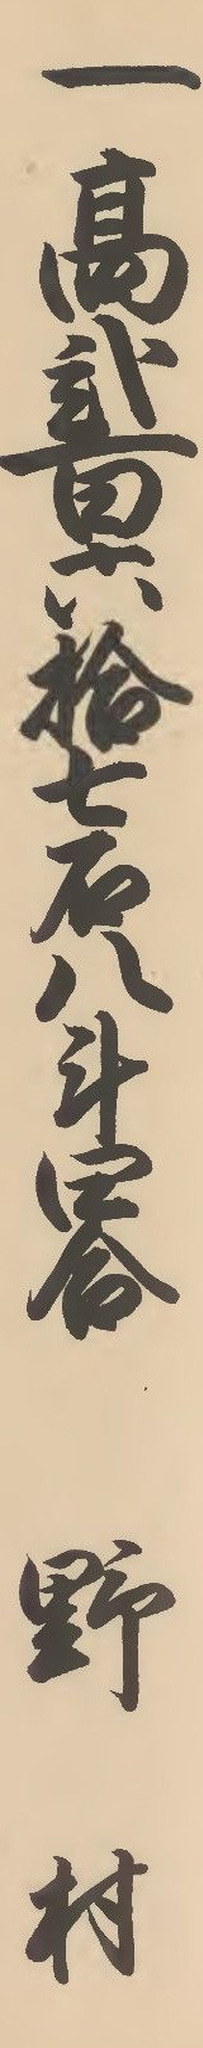一髙弐百六拾七石八斗四合野村
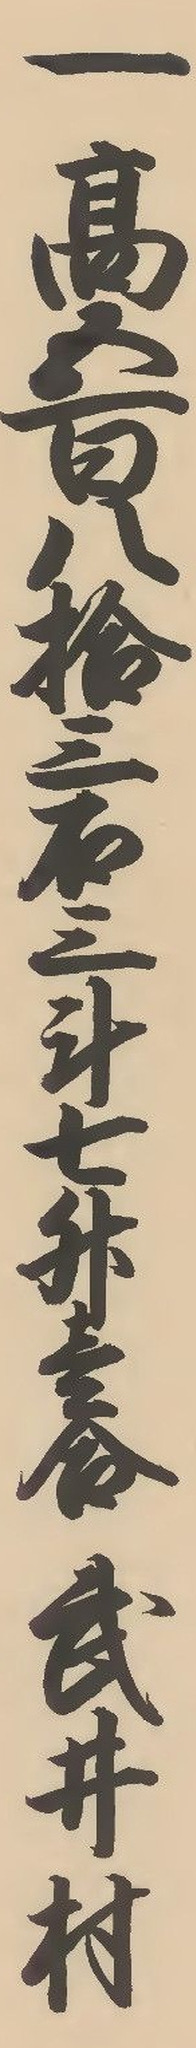一髙五百八拾三石三斗七升壱合武井村
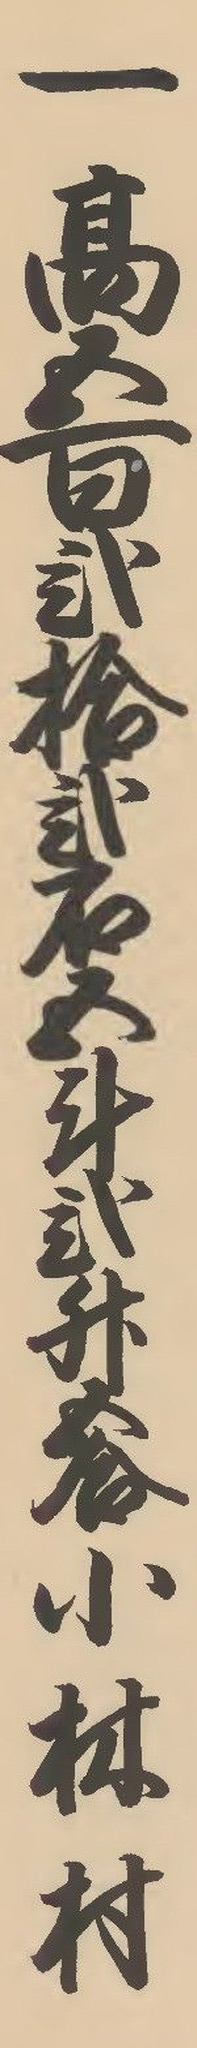一髙五百弐拾弐石五斗弐升五合小林村

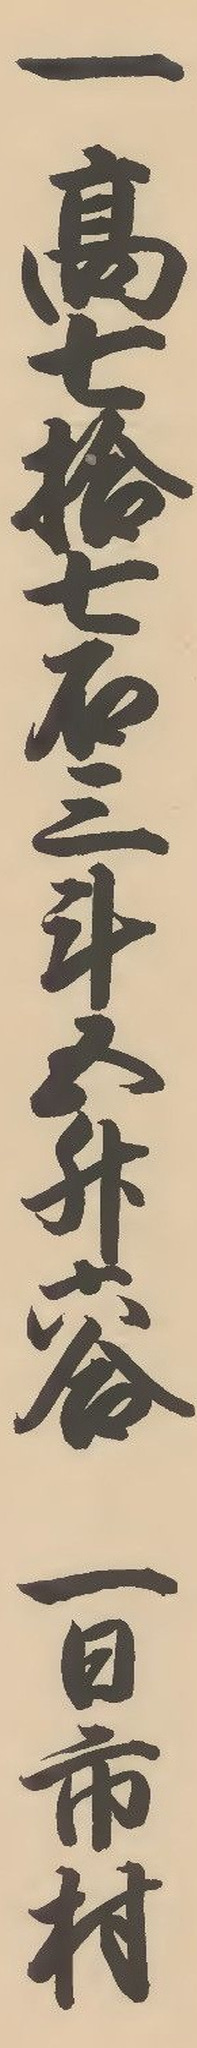一髙七拾七石三斗五升六合一日市村
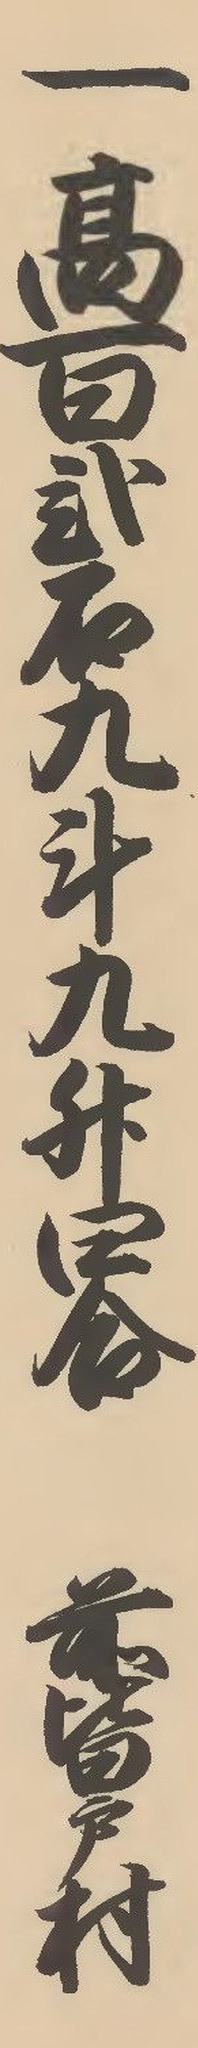一髙百弐石九斗九升四合前皆戸村
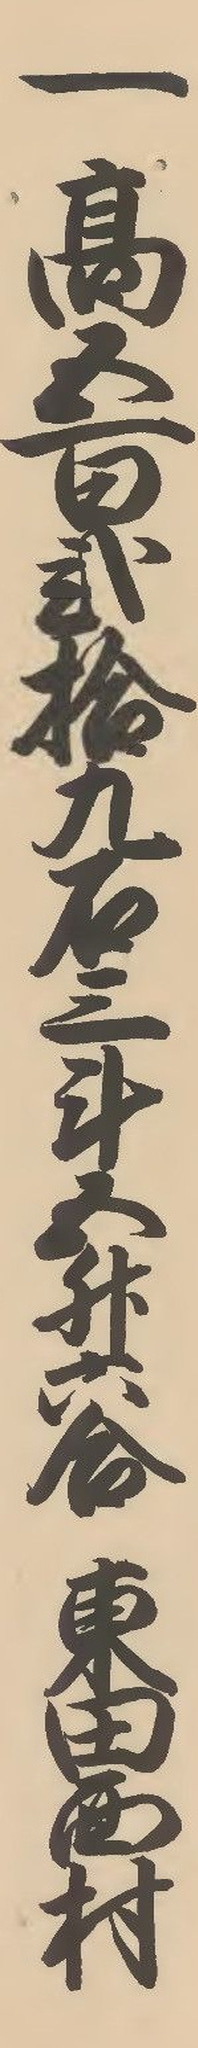一髙五百弐拾九石三斗五升六合東田西村
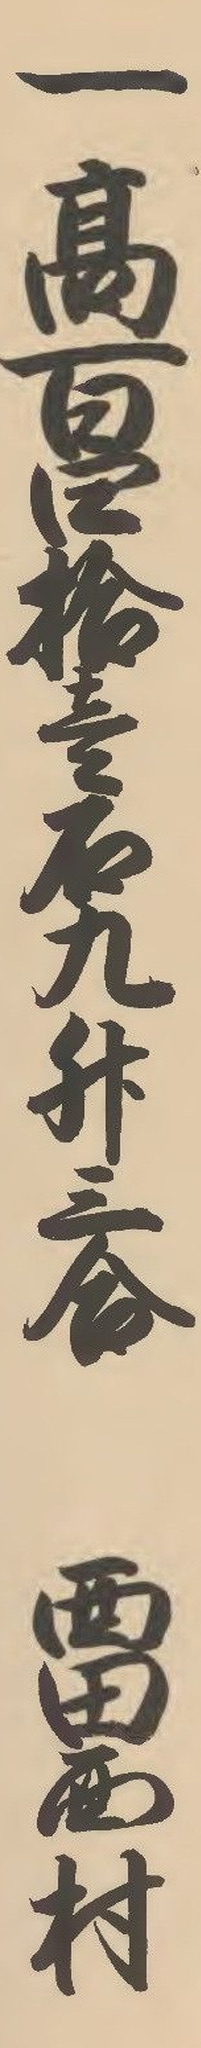一髙百四拾壱石九升三合西田西村
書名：上野国郷帳
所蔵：国立公文書館 National Archives of Japan
